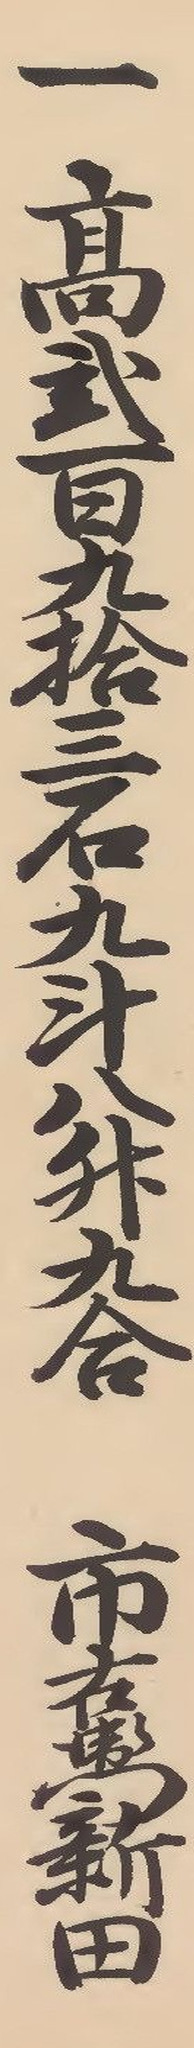一高弐百九拾三石九斗八升九合市右衛門新田
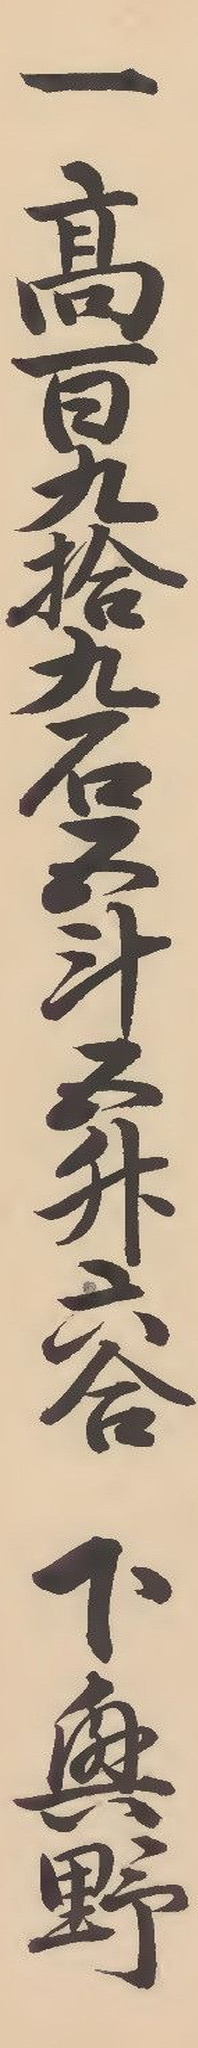一高百九拾九石五斗五升六合下興野

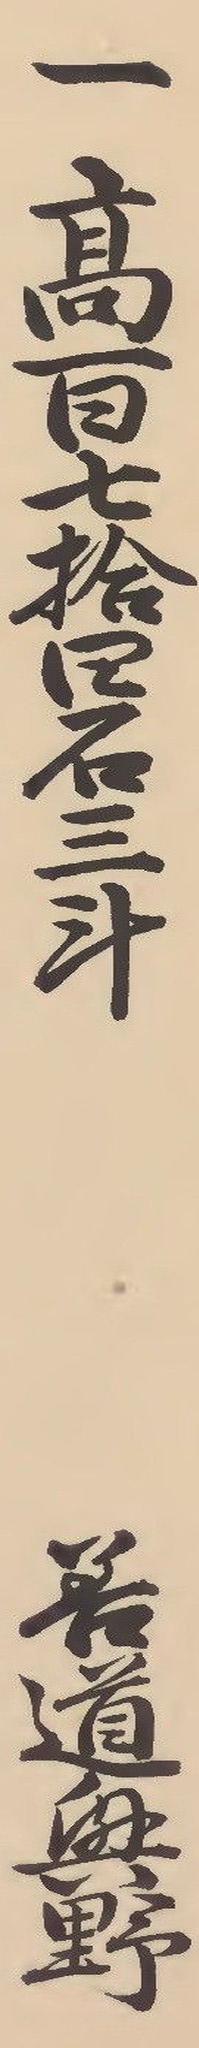一高百七拾四石三斗善道興野
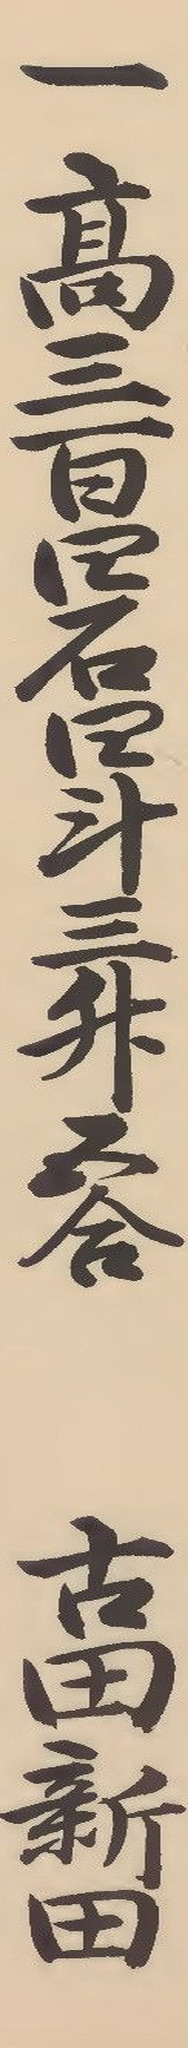一高三百四石四斗三升五合古田新田
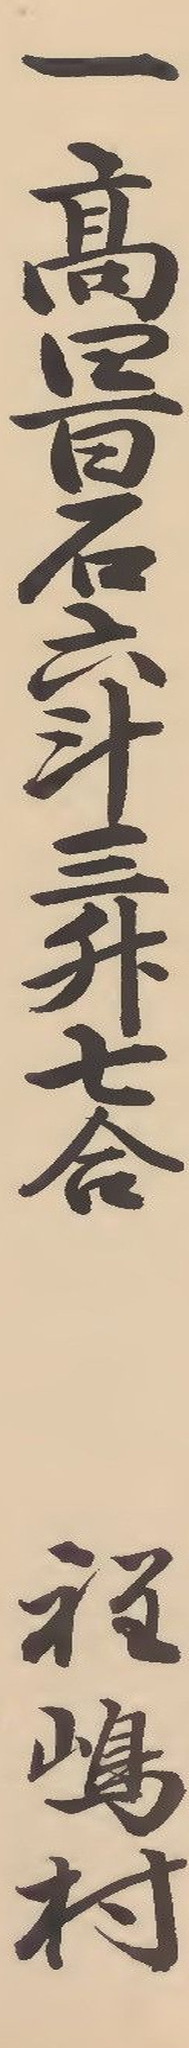一高四百石六斗三升七合程島村
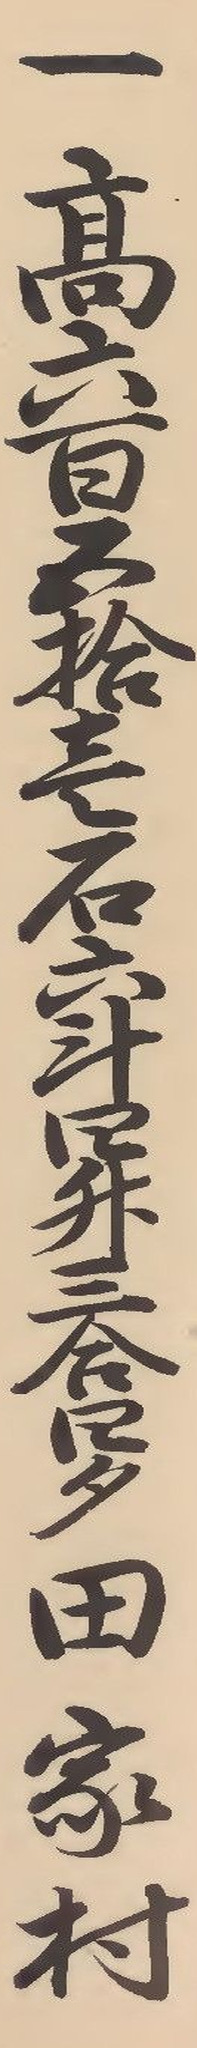一高六百五拾壱石六斗四升三合四勺田家村
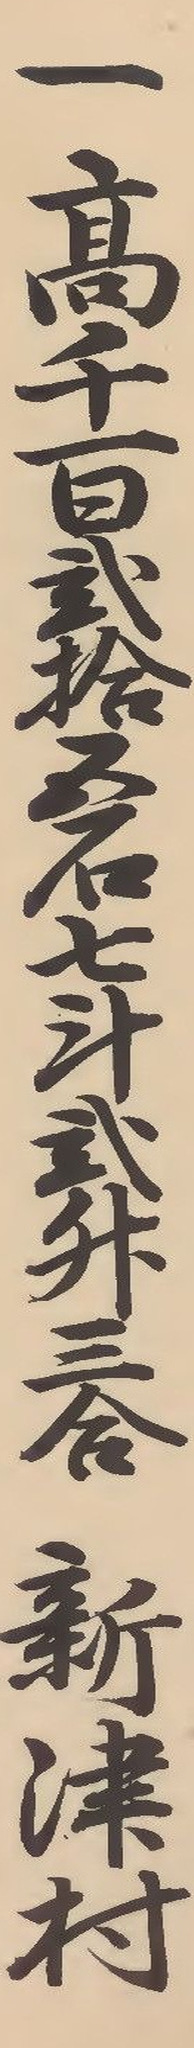一高千百弐拾五石七斗弐升三合新津村
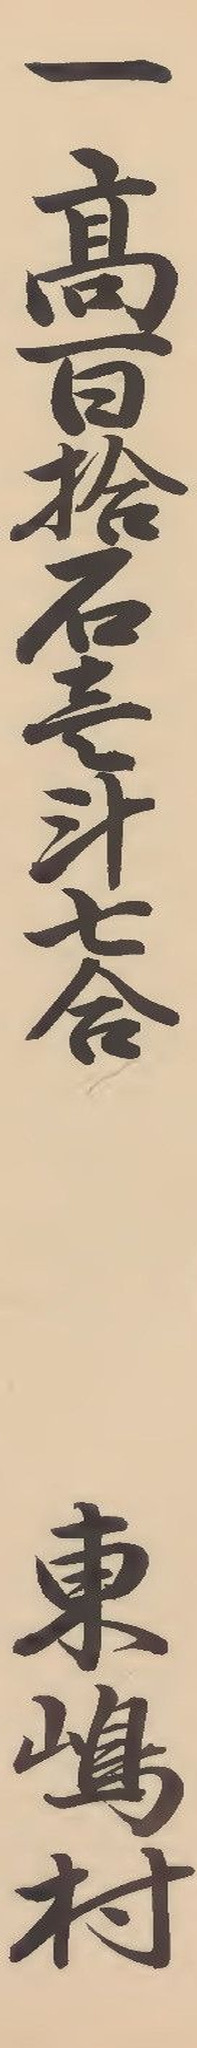一高百拾石壱斗七合東島村
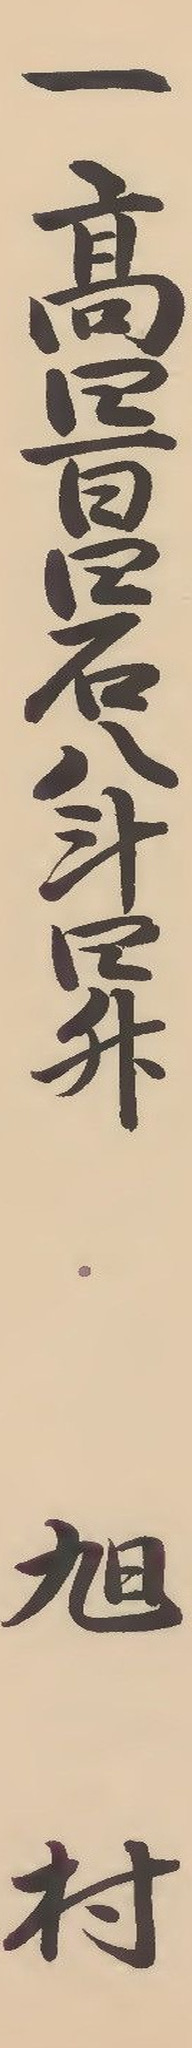一高四百四石八斗四升旭村

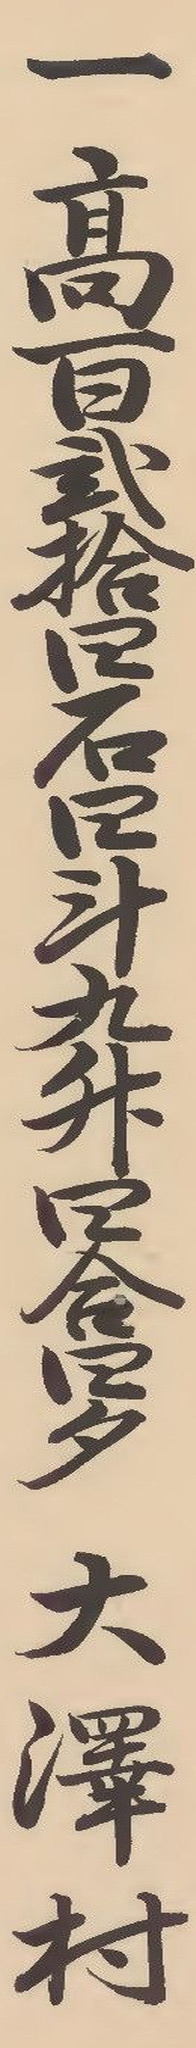一高百弐拾四石四斗九升四合四勺大沢村
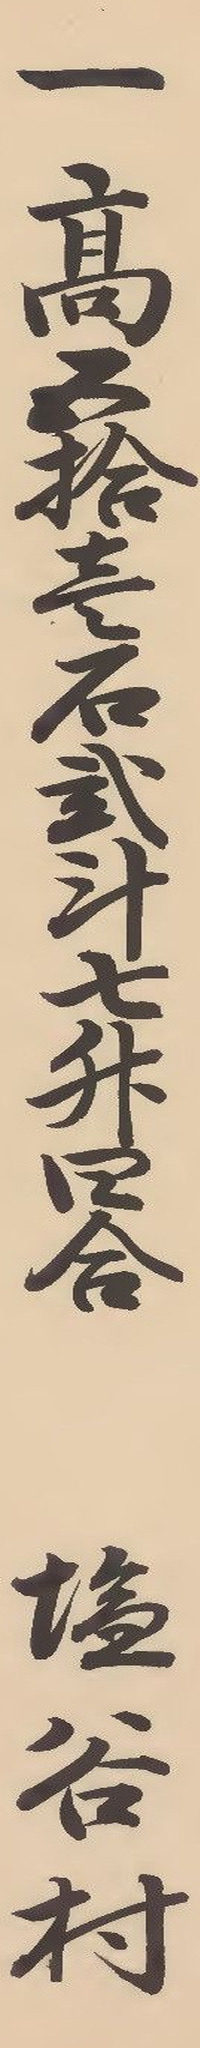一高五拾壱石弐斗七升四合塩谷村
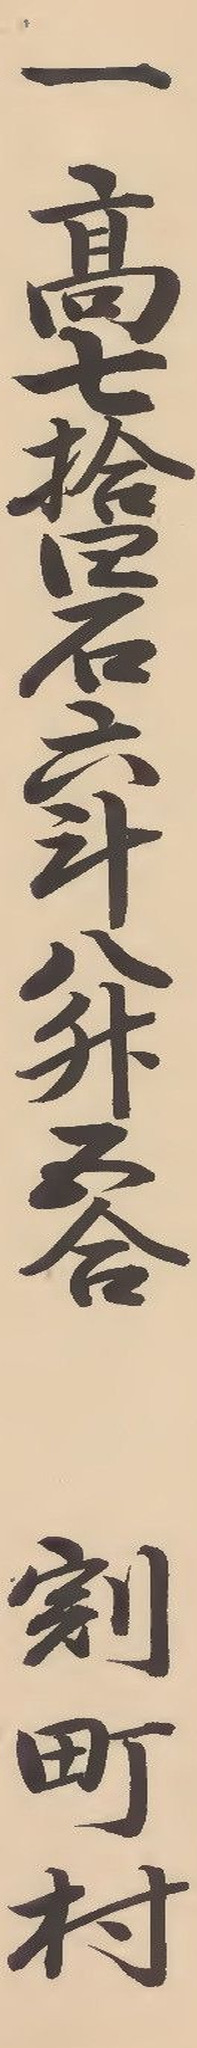一高七拾四石六斗八升五合割町村
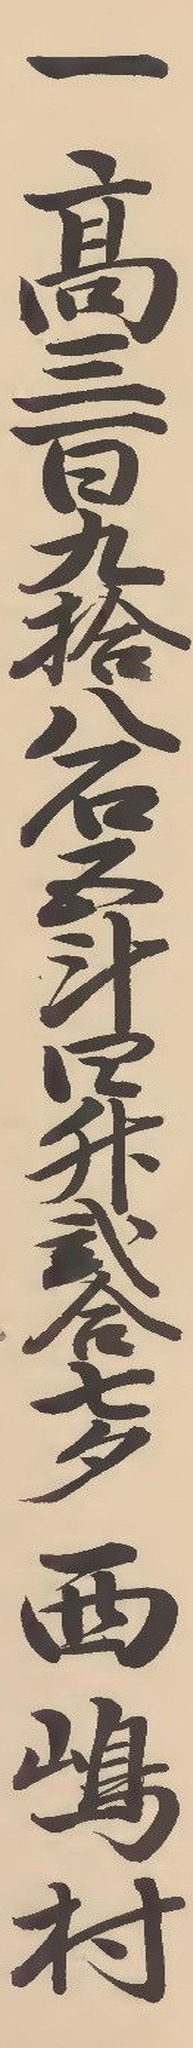一高三百九拾八石五斗四升弐合七勺西島村
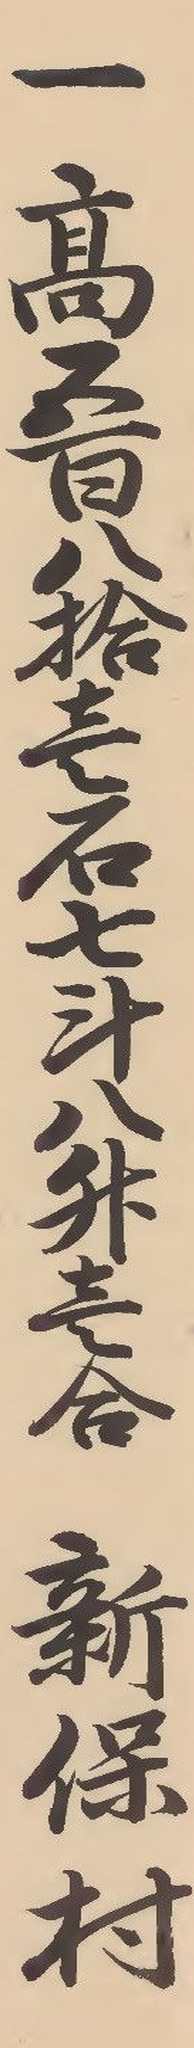一高五百八拾壱石七斗八升壱合新保村
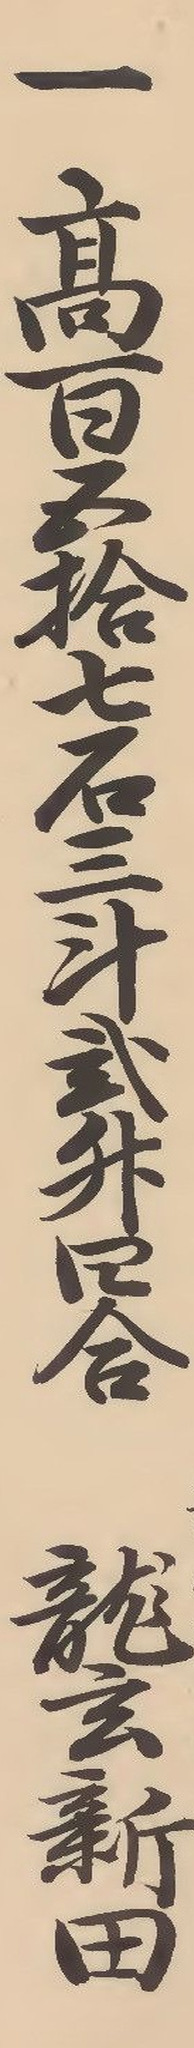一高百五拾七石三斗弐升四合竜玄新田
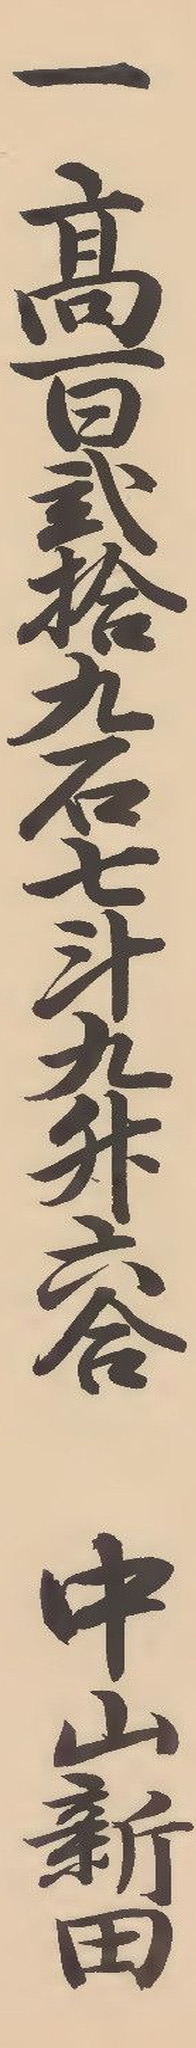一高百弐拾九石七斗九升六合中山新田
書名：越後国郷帳　下
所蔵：国立公文書館 National Archives of Japan
